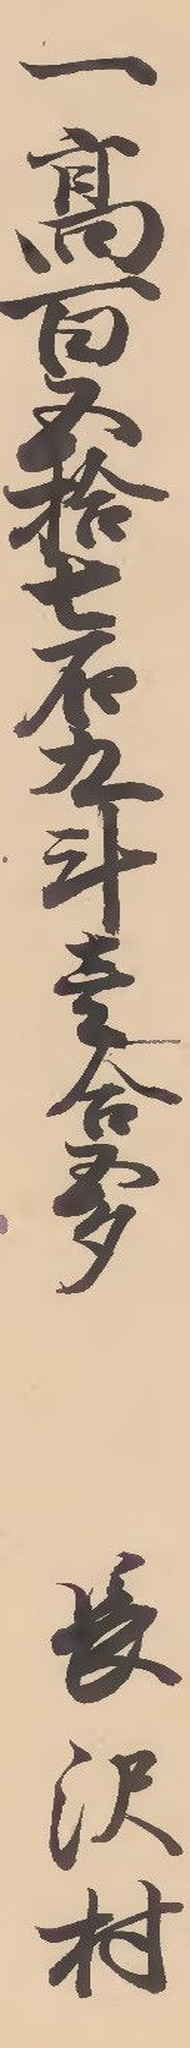一高百五拾七石九斗壱合五勺長沢村

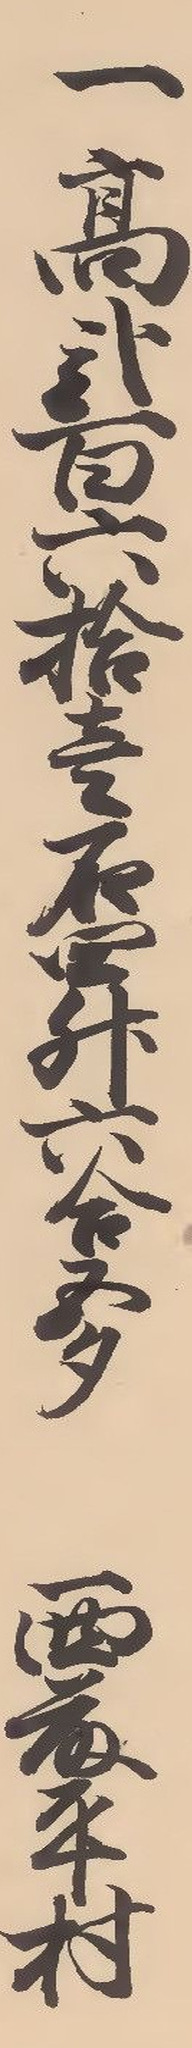一高弐百六拾壱石四升六合五勺西藤平村
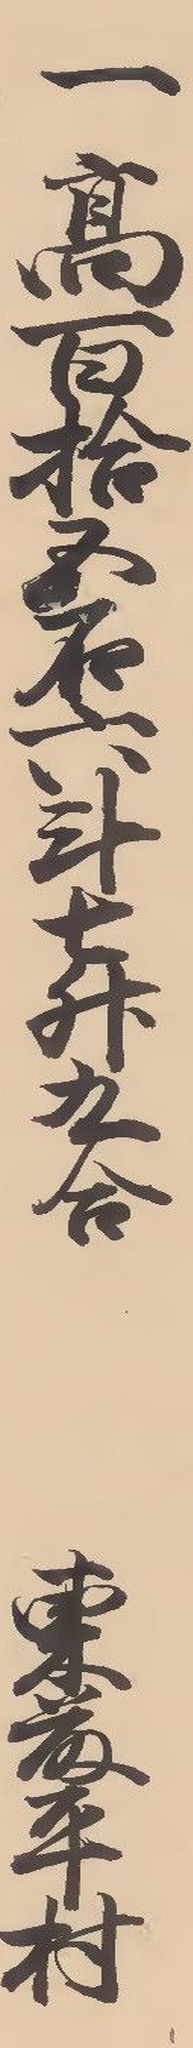一高百拾五石六斗七升九合東藤平村
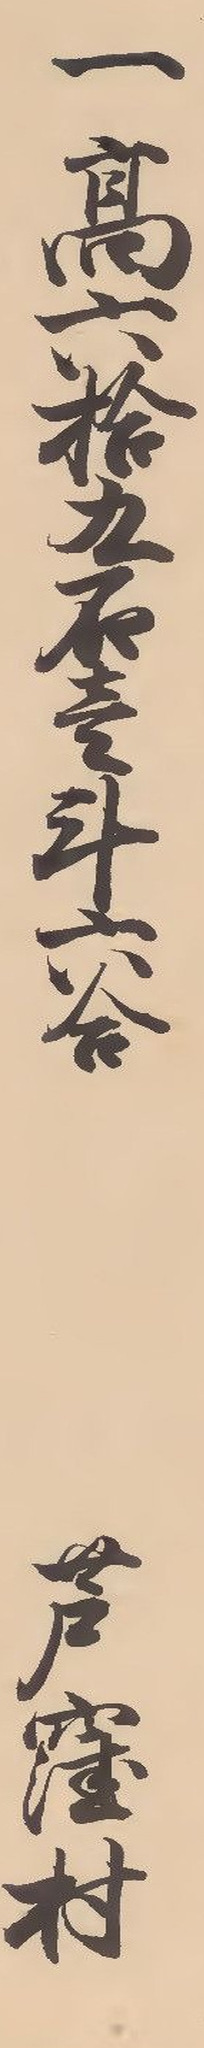一高六拾九石壱斗六合芦窪村
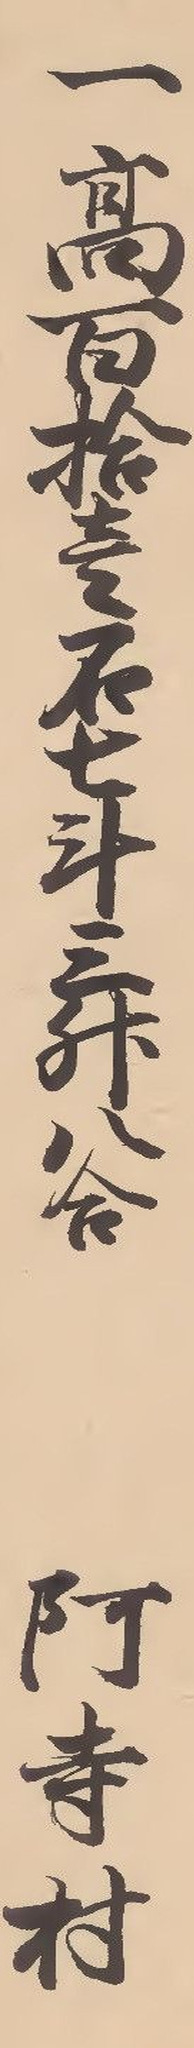一高百拾壱石七斗三升八合阿寺村
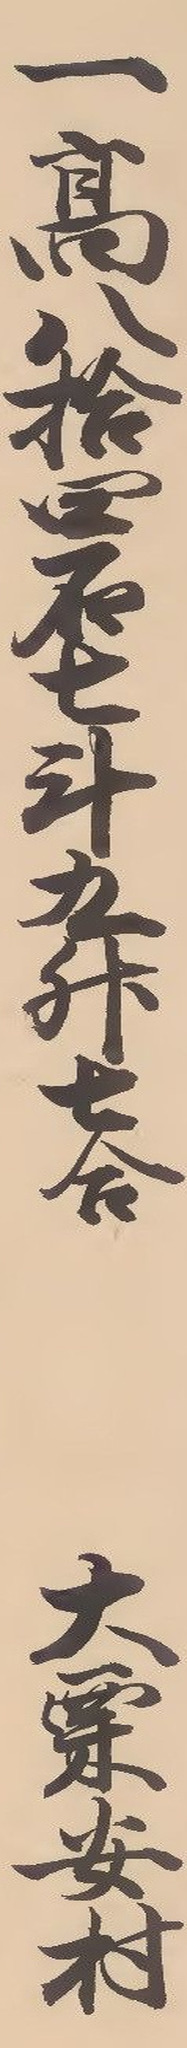一高八拾四石七斗九升七合大栗安村
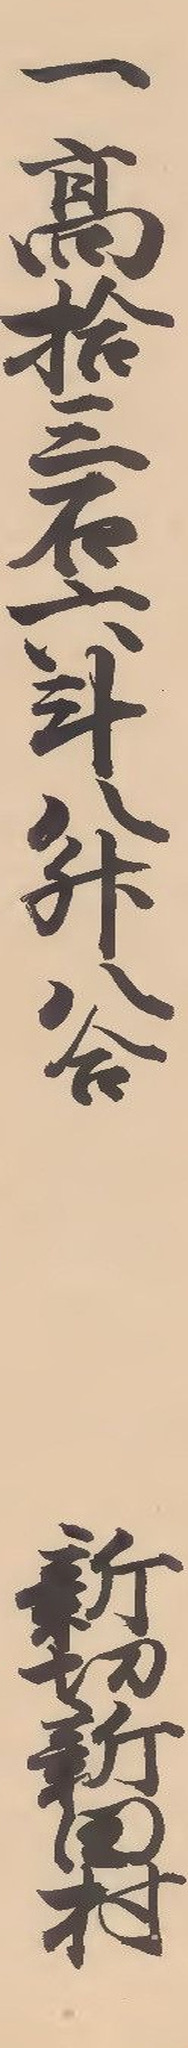一高拾三石六斗八升八合新切新田村
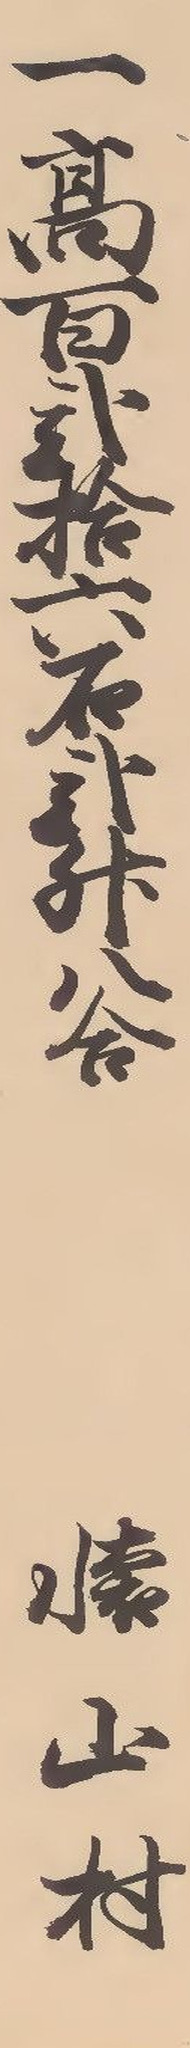一高百弐拾六石弐升八合懐山村
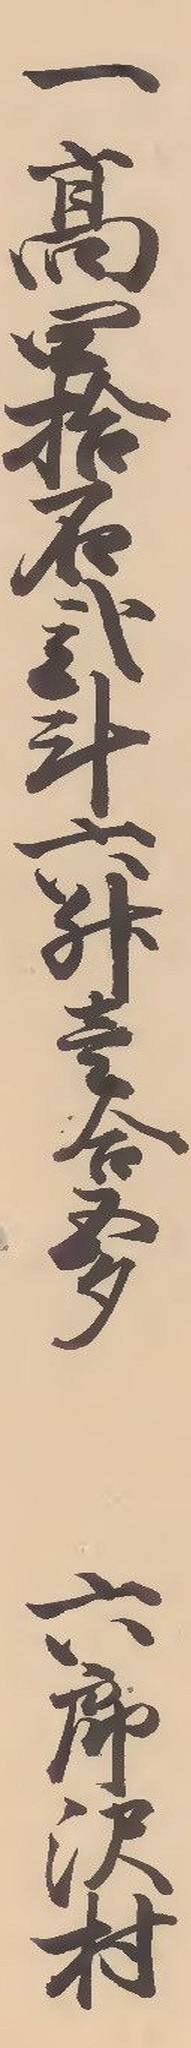一高四拾石弐斗六升壱合五勺六郎沢村

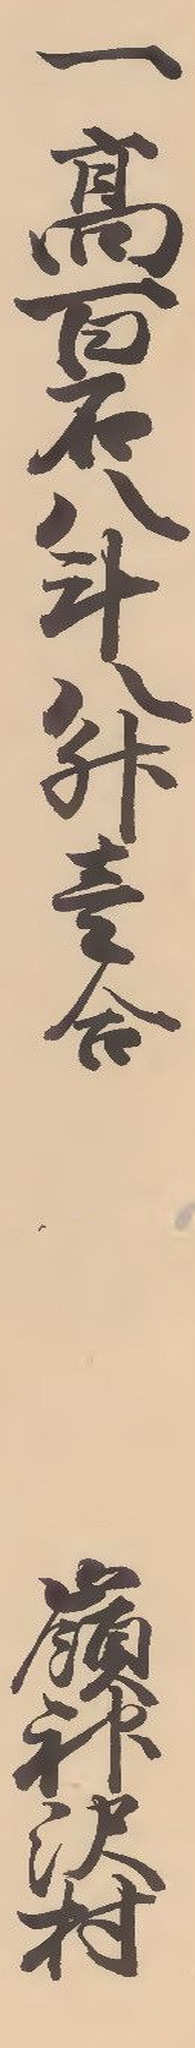一高百石八斗八升壱合嶺神沢村
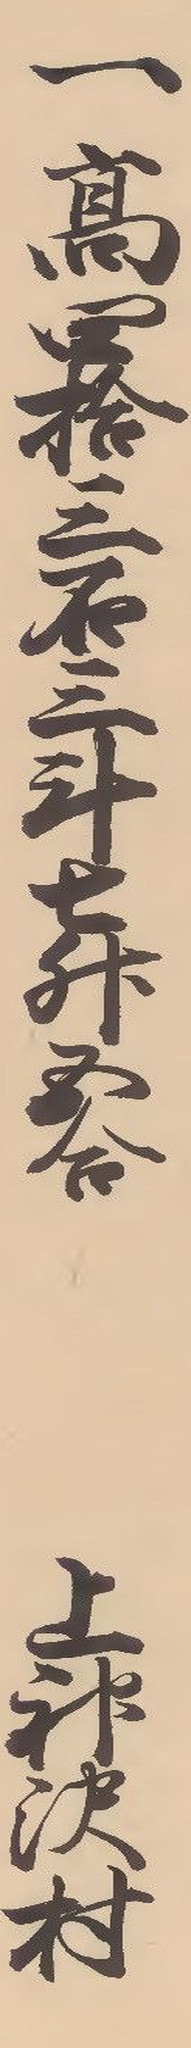一高四拾三石三斗七升五合上神沢村
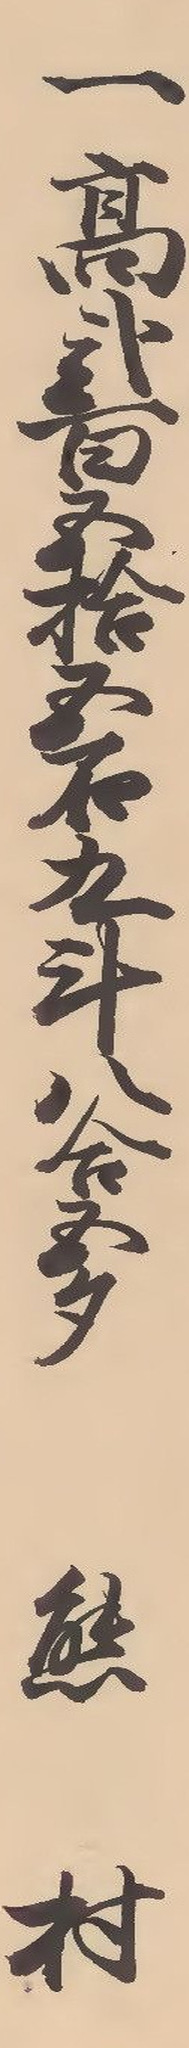一高弐百五拾五石九斗八合五勺熊村
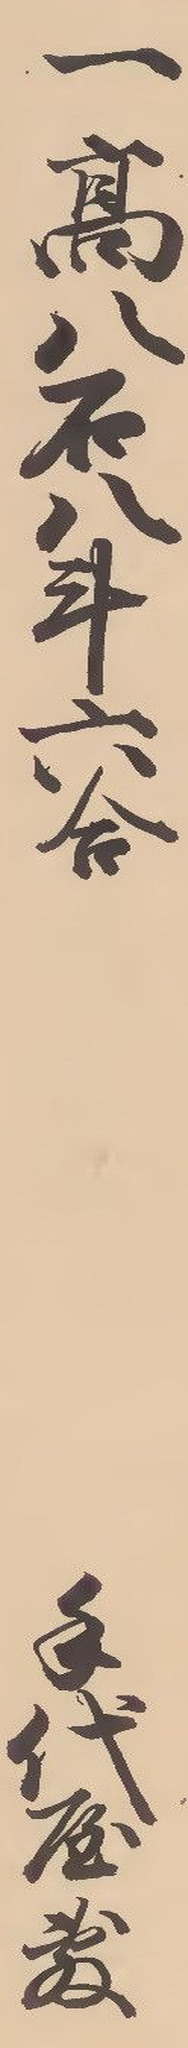一高八石八斗六合手代屋敷
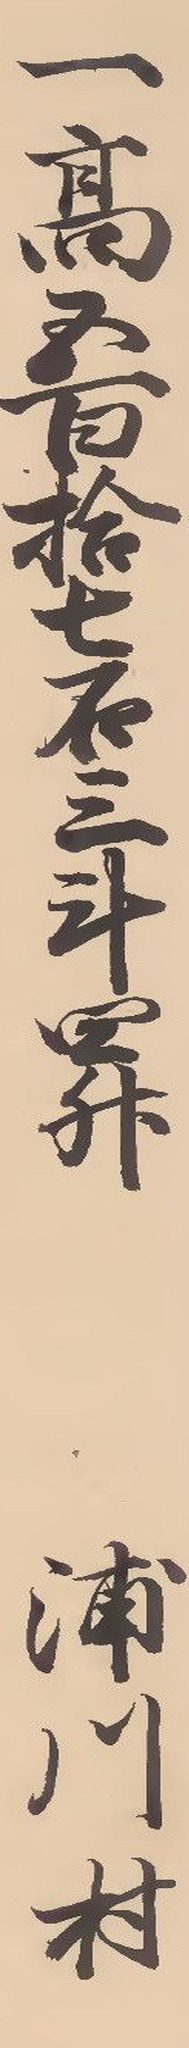一高五百拾七石三斗四升浦川村
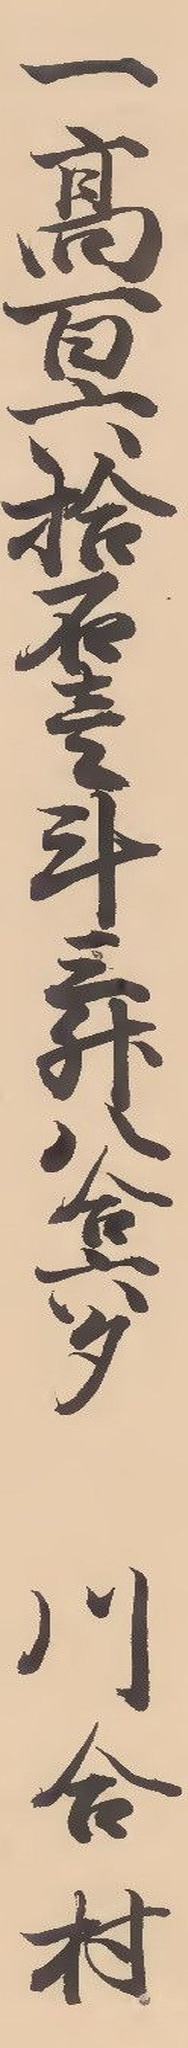一高百六拾石壱斗三升八合六勺川合村
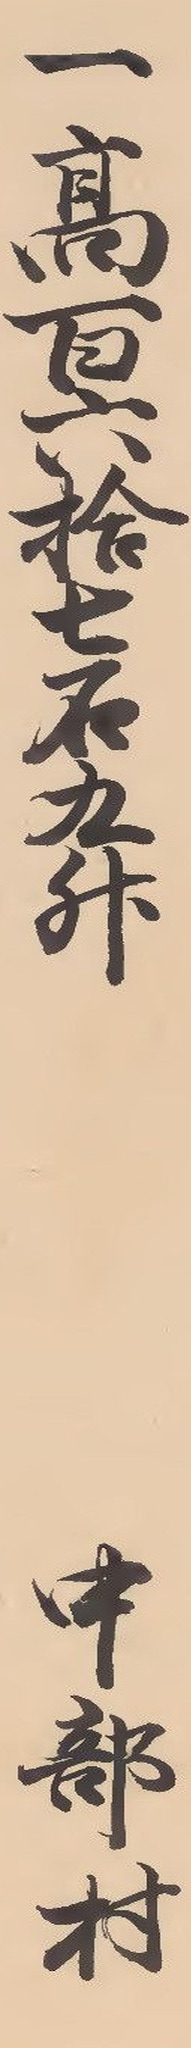一高百六拾七石九升中部村
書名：遠江国郷帳
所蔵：国立公文書館 National Archives of Japan
